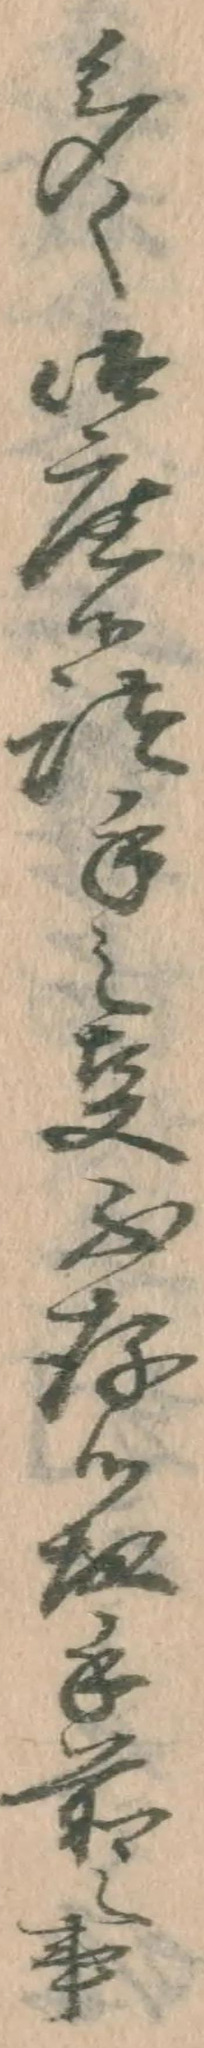多く御座候諸手之事ふ存候故手前之事
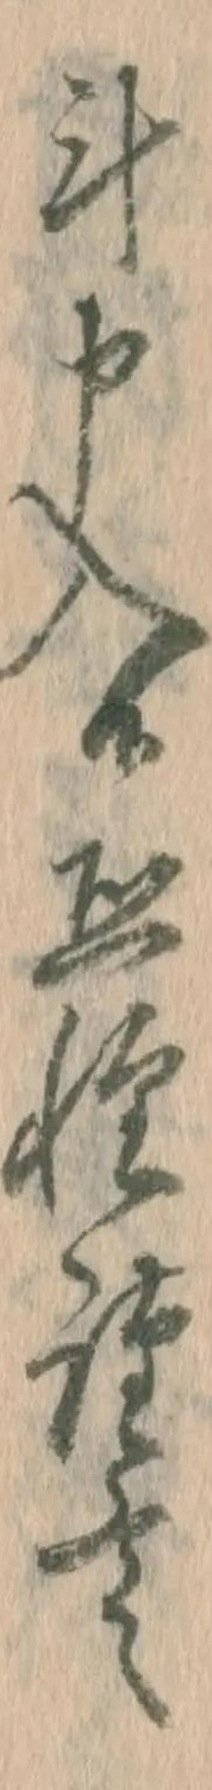斗申入候恐惶謹言
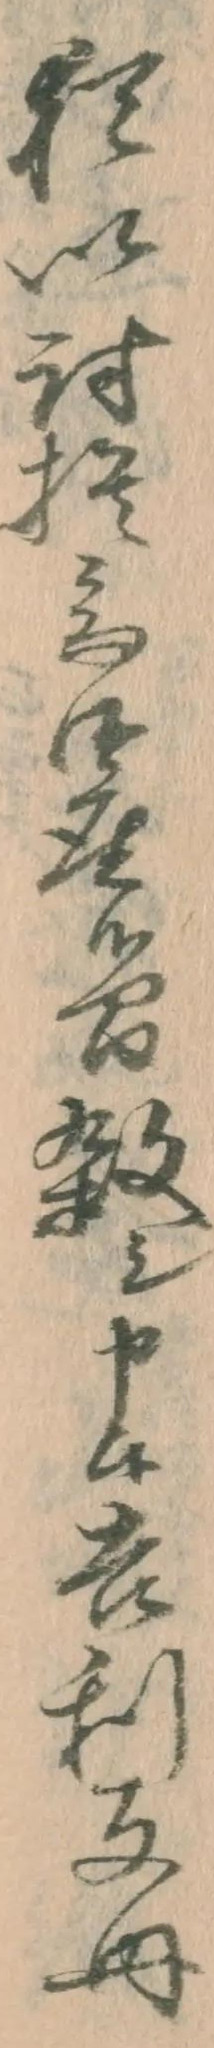猶以討捨に而御座候間殺し申候吉利支丹
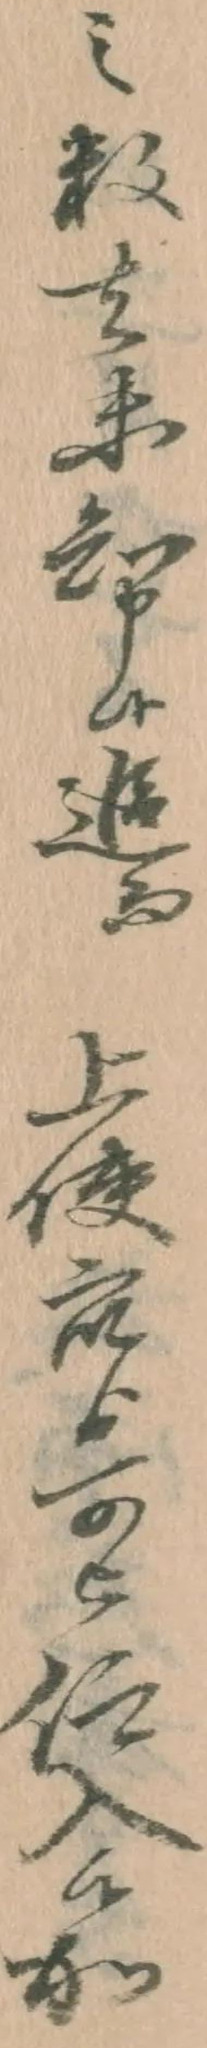之数者未知申候追而上使衆ゟ可被仰入候加
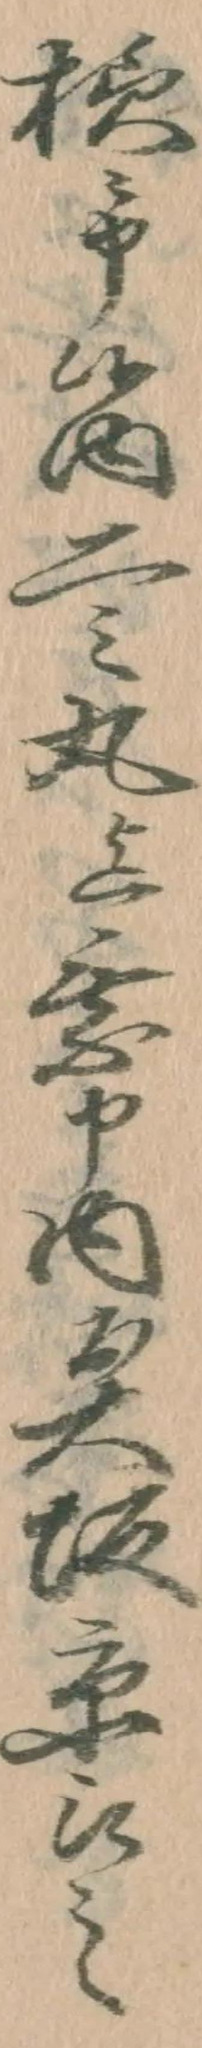様に申候内二之丸迄乗申内ゟ大坂京江之
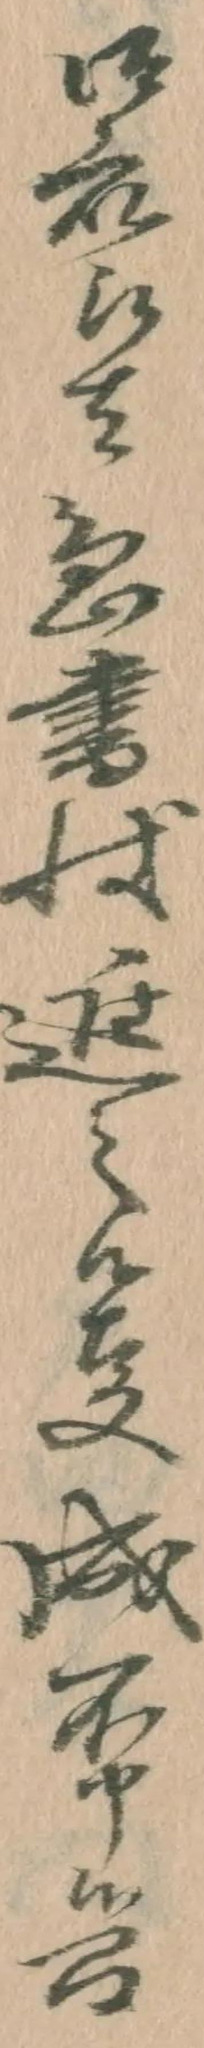御衆江者急書状進之候事成不申候間
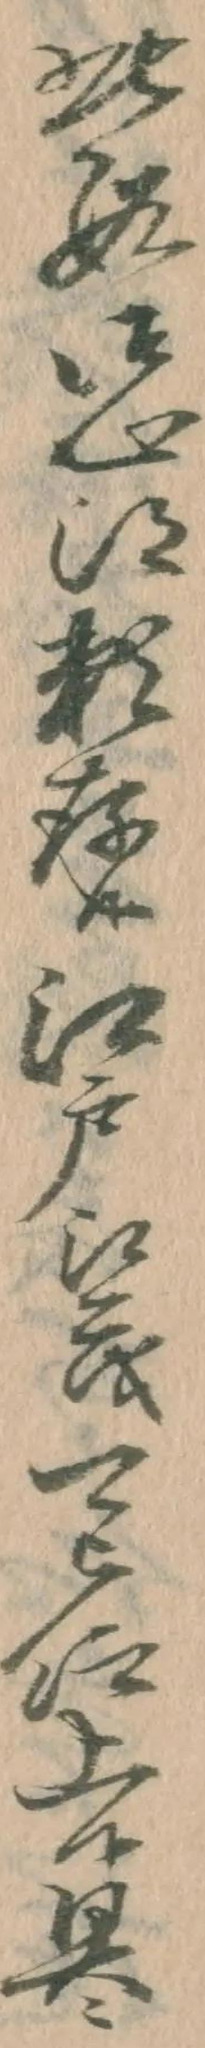此如御心得類存候江戸江茂可被仰上候具に
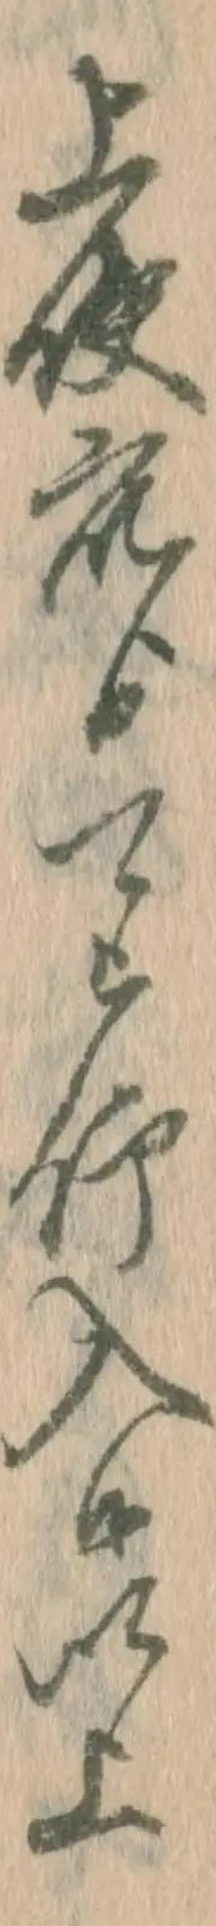上使衆ゟ可被仰入候以上
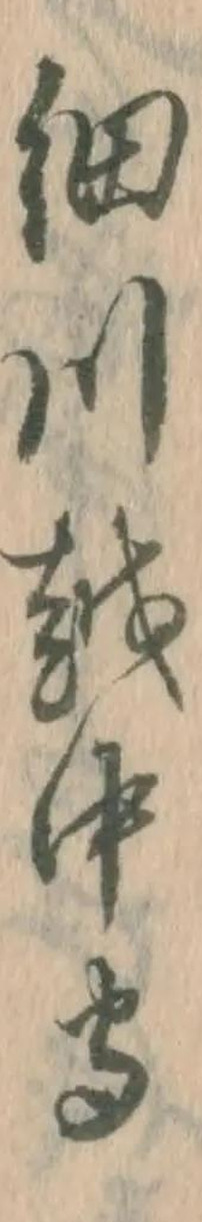細川肥後守
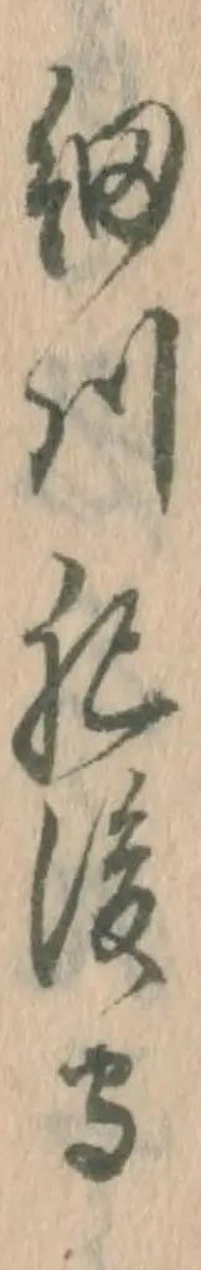細川肥後守
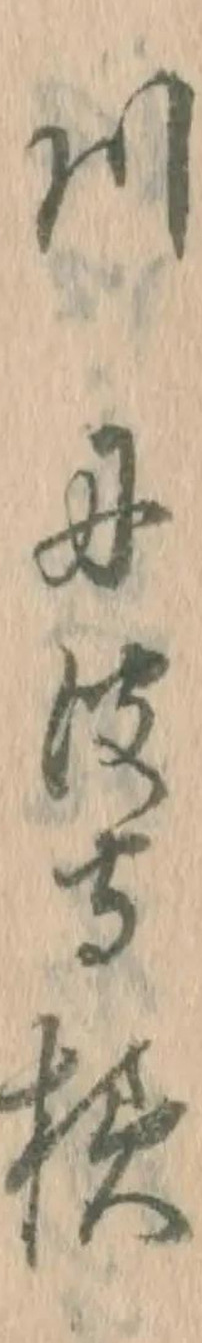川丹波守様
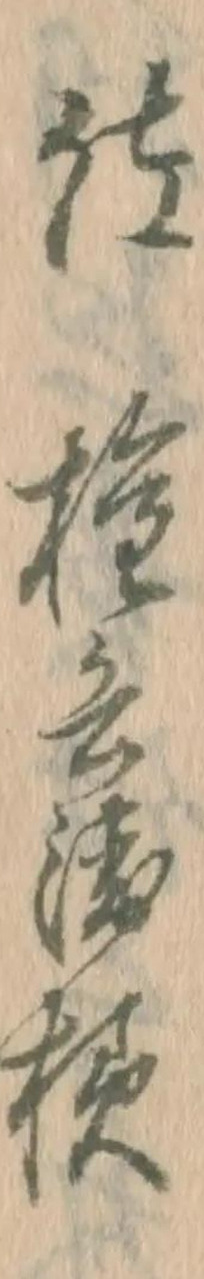佐権兵衛様
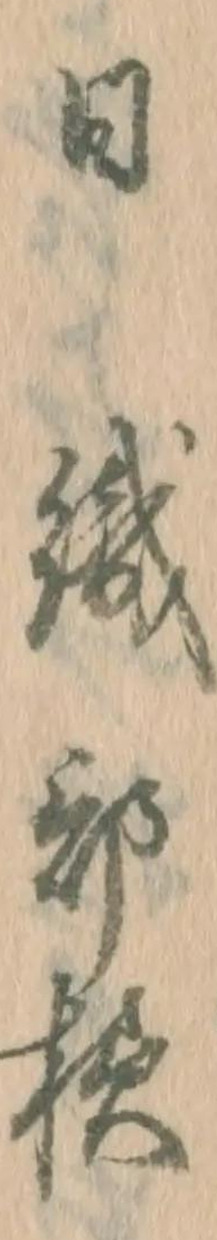同織部様

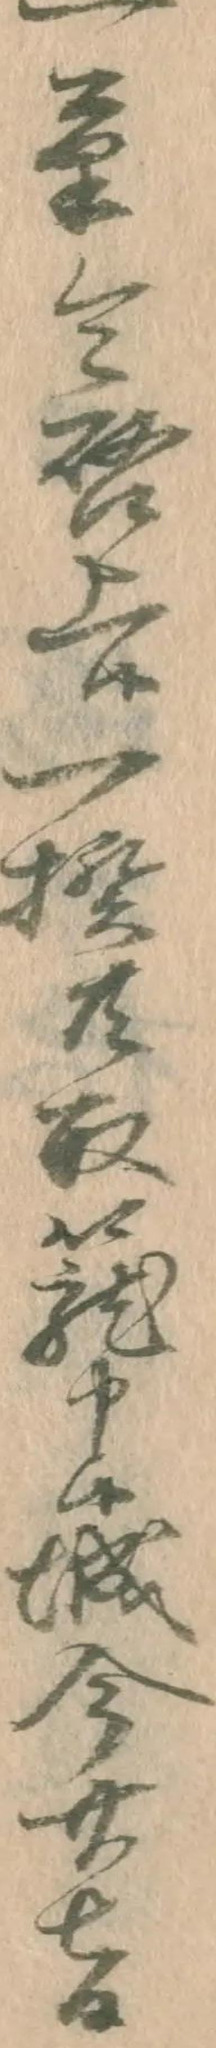一筆令啓上候一揆共取籠申候城今廿七日
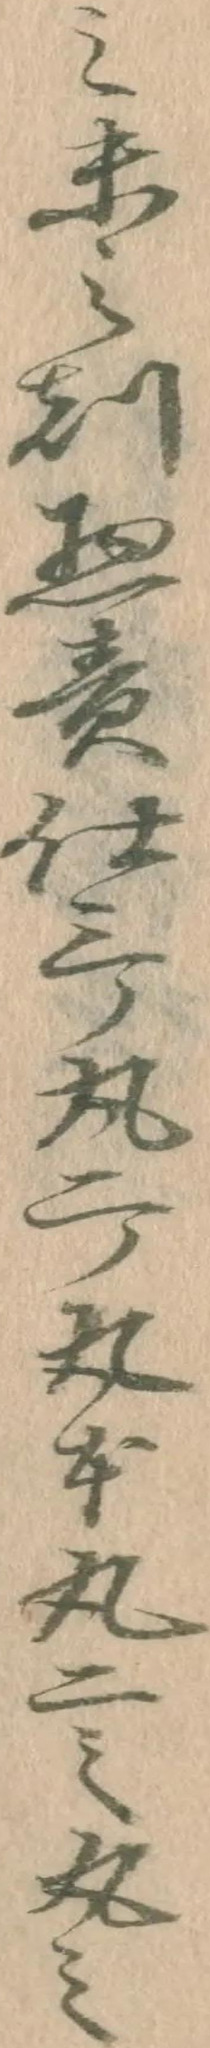之未之刻惣責仕三之丸二之丸本丸二之丸之
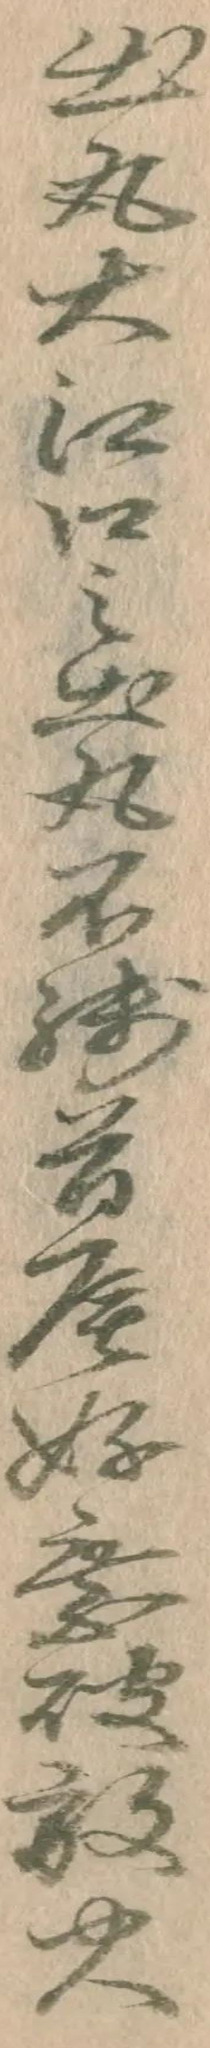出丸大江口之出丸不残首尾好乗破放火
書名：切支丹御退治記 49巻. [8]
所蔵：国立国会図書館 National Diet Library, JAPAN
